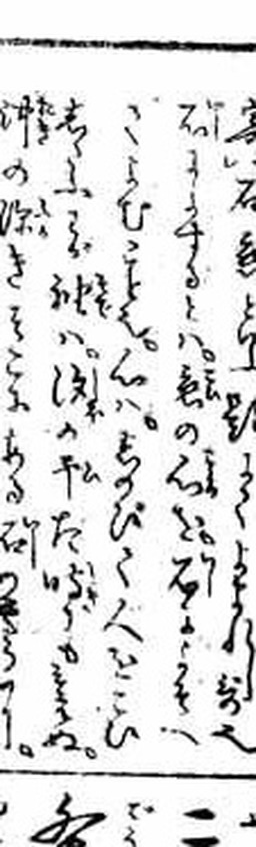てよむこと也心はしのびて人をこひ
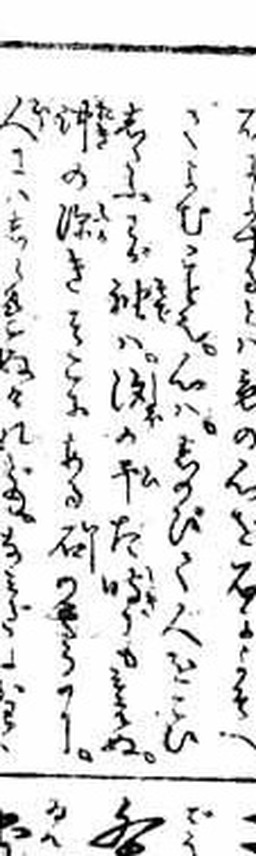したふわが袖は汐の干たときもみえぬ条
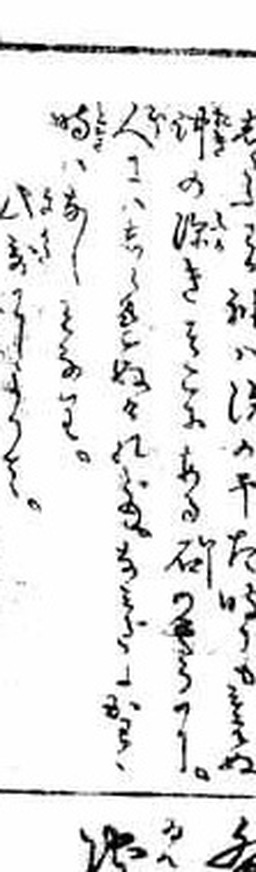人にしられぬけれどもなみだにかわく殷
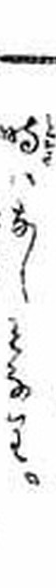時はなしとなり
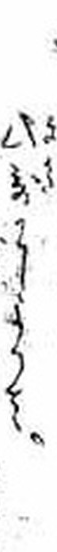此哥によりて讃
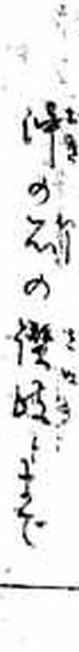沖の石の讃岐とまで
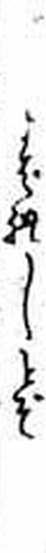よばれしとぞ岐
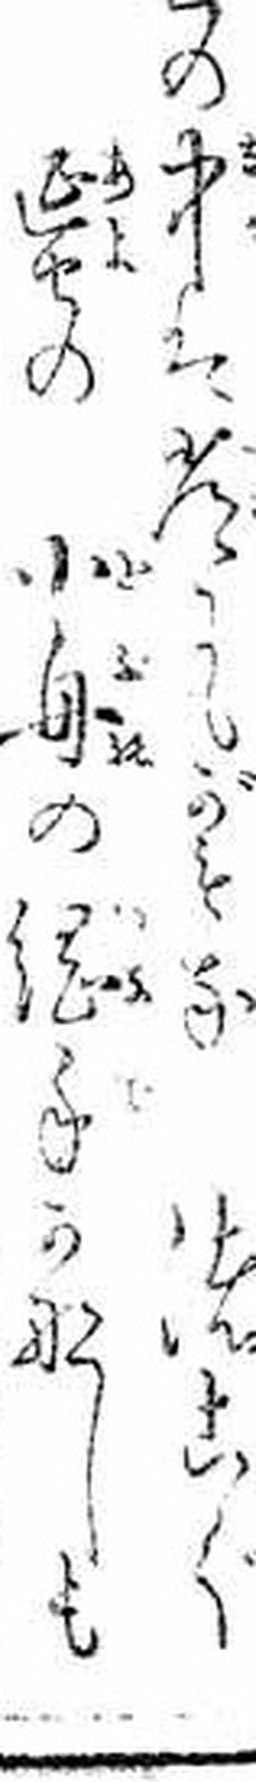塰の小舟の綱手かなしも
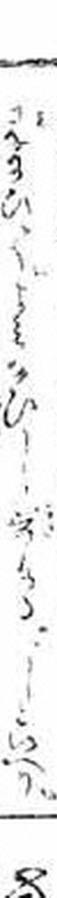見給ひてよみ給ひし哥なりといへり鎌倉
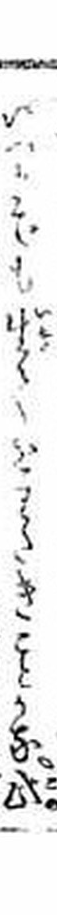いつまでも生きてをりたきことかな此
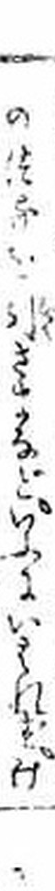のつなを引さまなどいふにいはれずけ
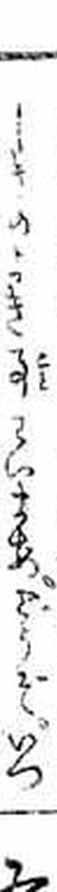しきのよき事いまあどうぞいつ右
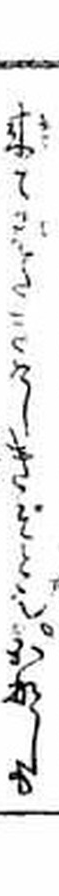來て見たきけしきぞと也かなしも大
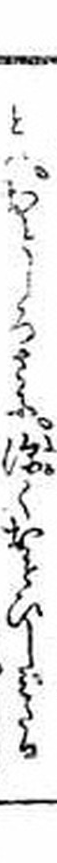とはおもしろさに深くおもひしみたる

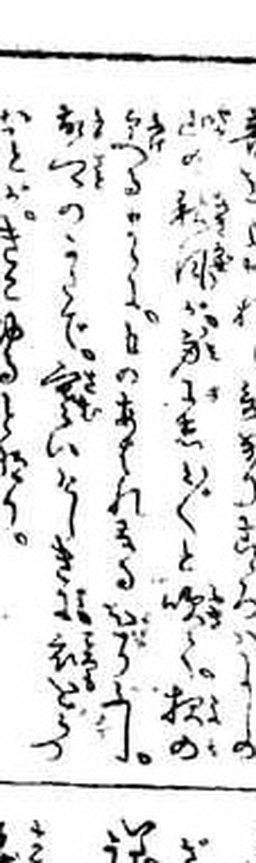更るやうにものあはれなるをりふし議
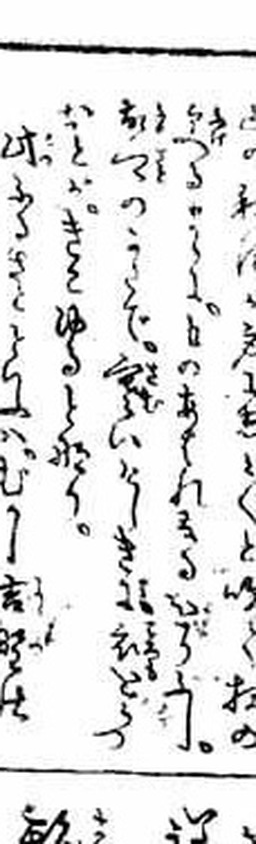古里のかたで寒いけしきに衣をうつ
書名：小倉百人一首
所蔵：東京学芸大学教育コンテンツアーカイブ
